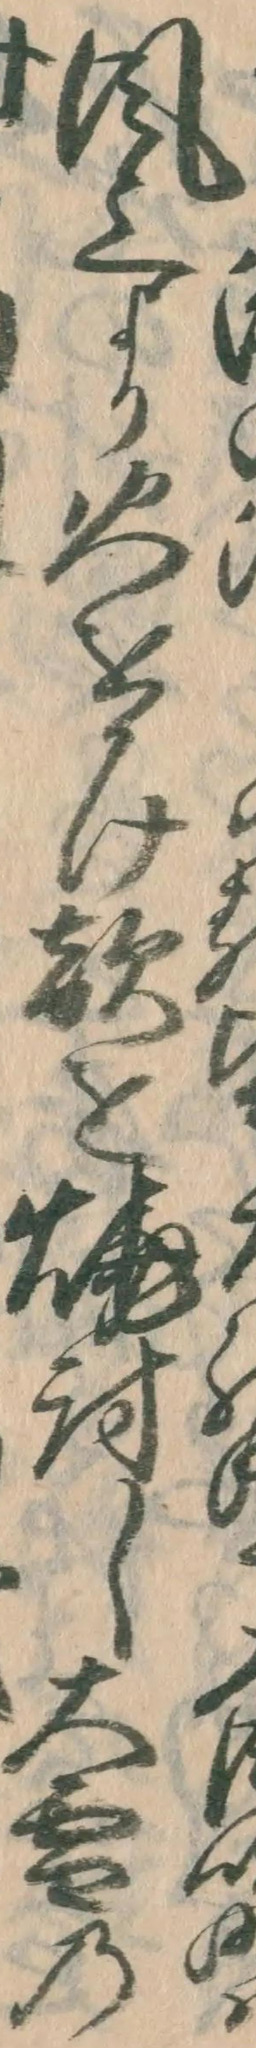風上より火をかけ敵を燒討し大雪の
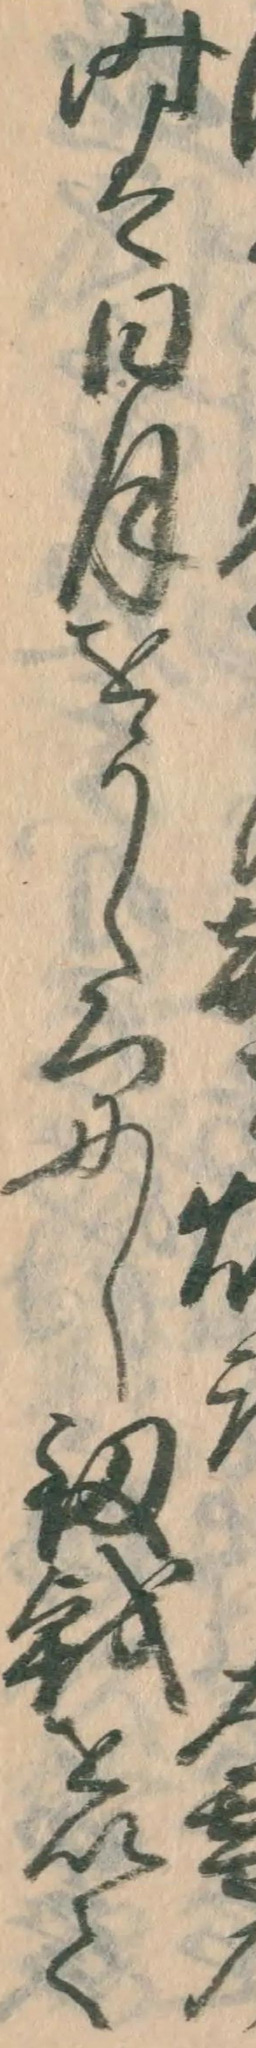時は日月をうしろにし釼戟を以て

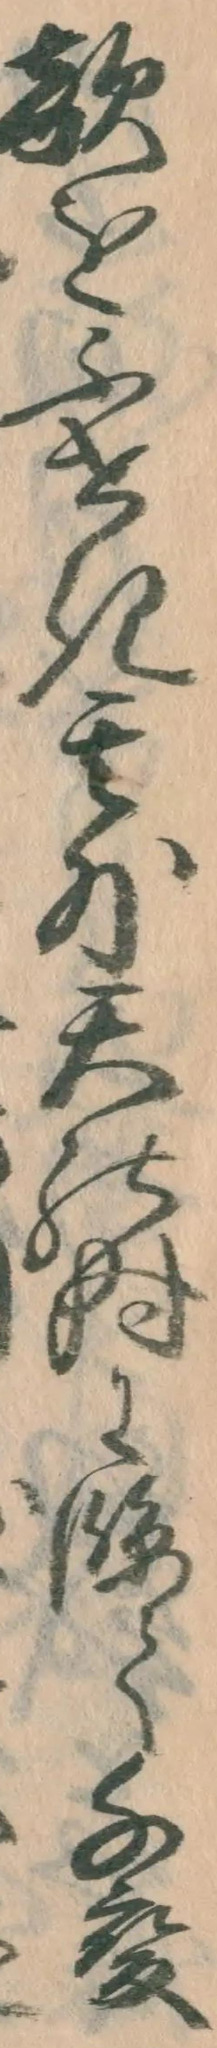敵をふせき其外天の時に臨て千変
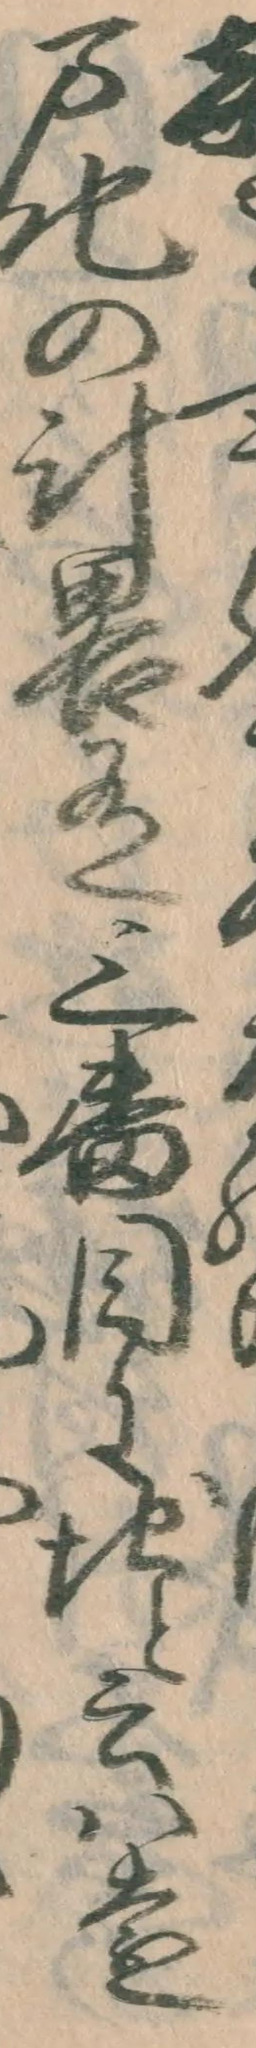万化の計略有三番目に地と云ハ遠
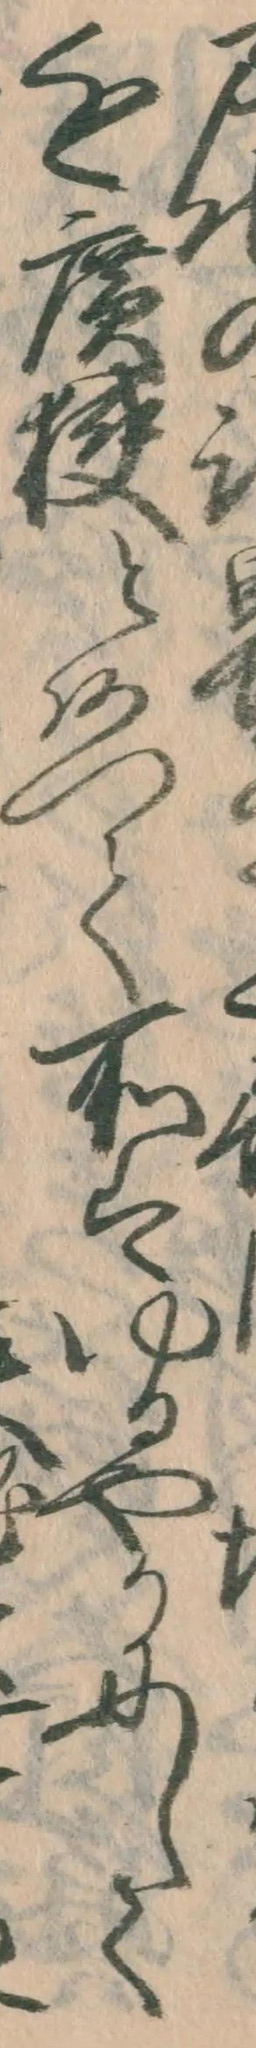近廣狭とあつて所はゆるやかにして
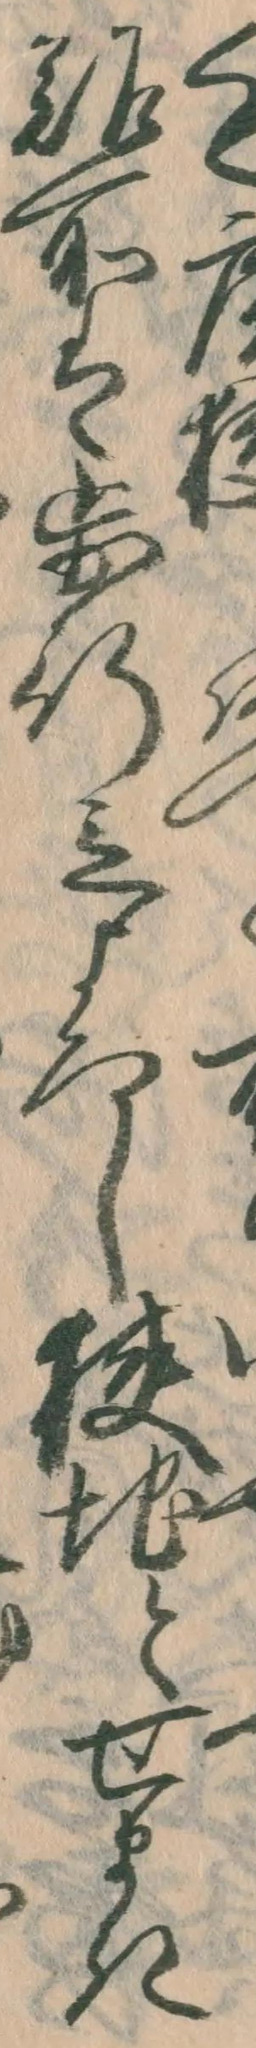難所は歩行立よろし狭地とせまき
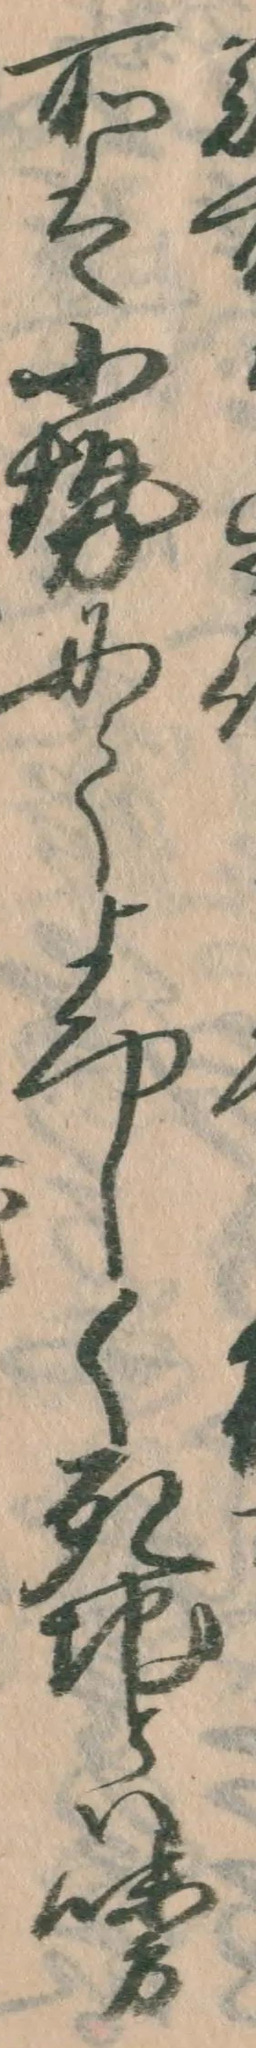所は小勢にてよろしく死地とハ味方
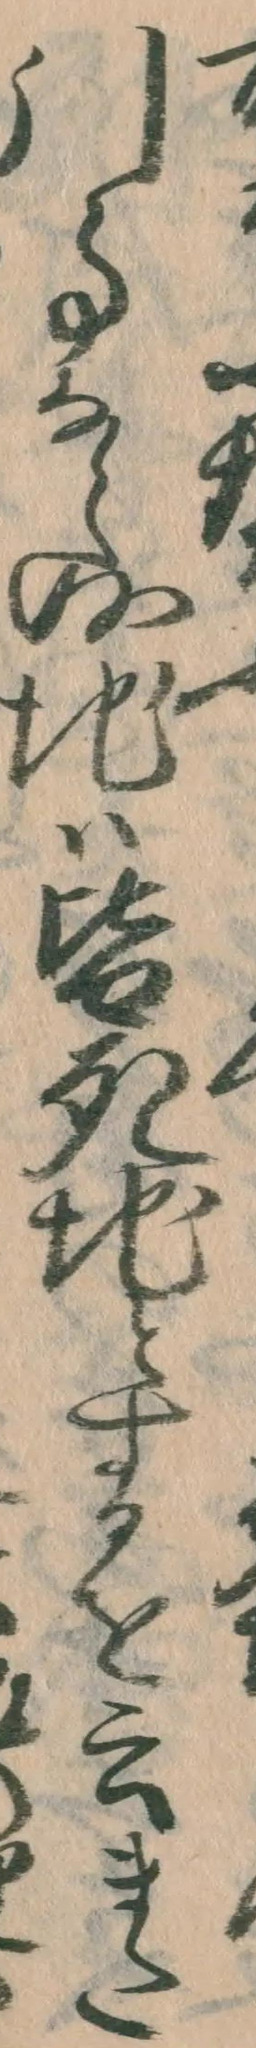引く事ならぬ地ハ皆死地とするを云また
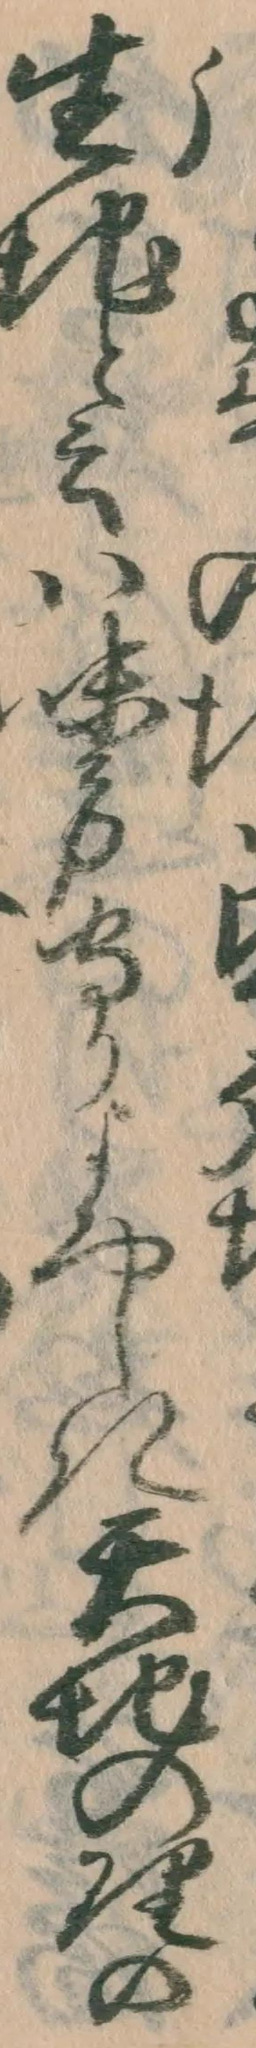生地と云ハ味方守りよろしき天地の理の
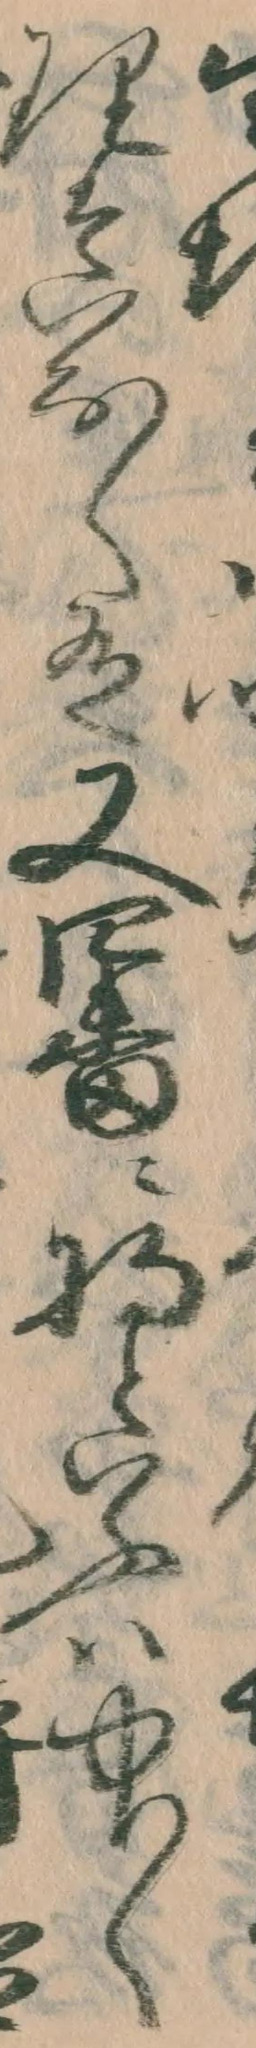理はいろ〳〵有又四番二将といふハ中〳〵
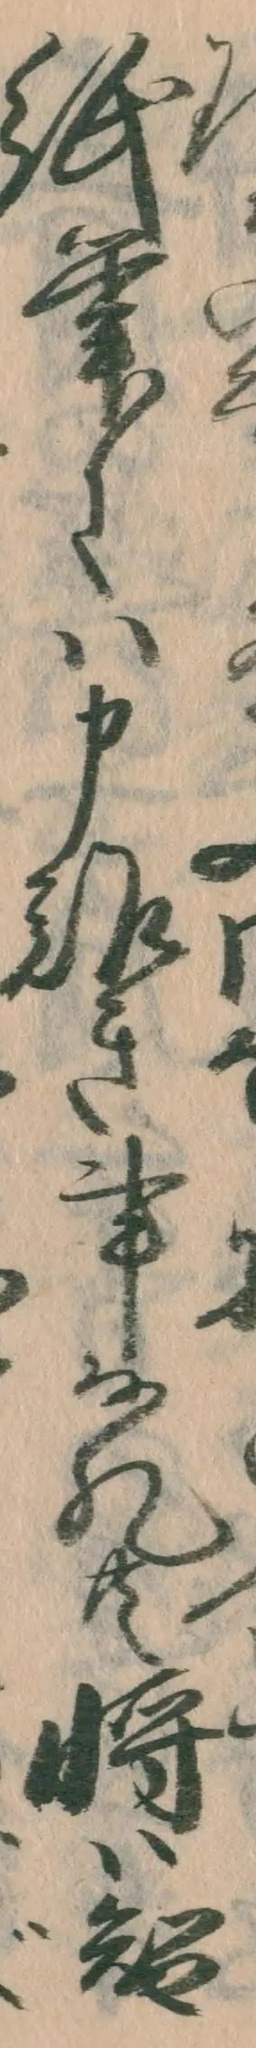紙筆にハ申難き事なれ共将ハ智
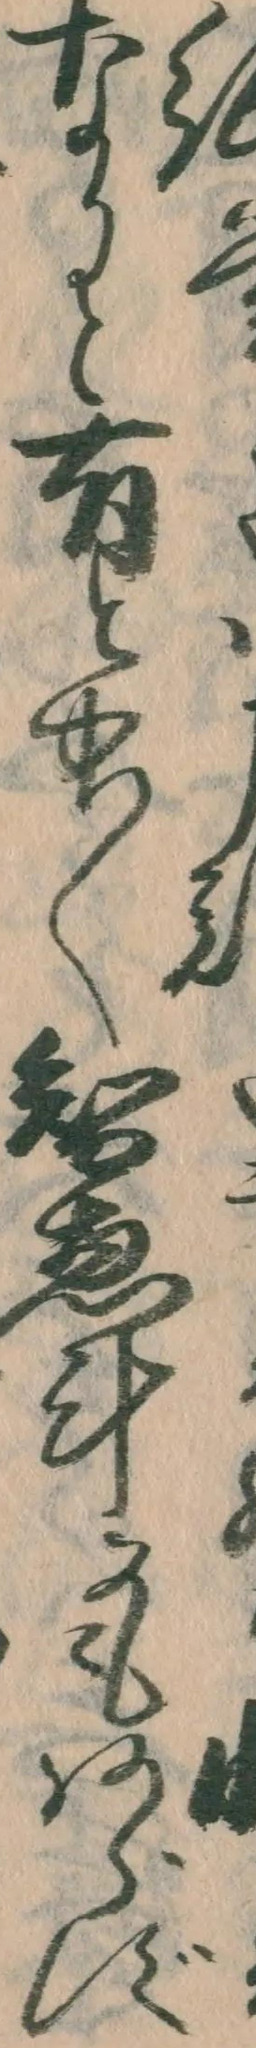なると有と中〳〵智恵斗にもあらず
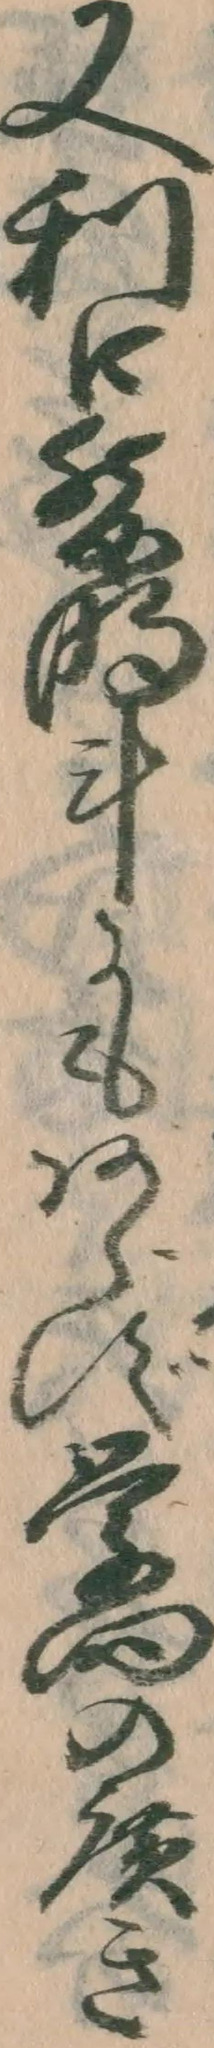又利口発明斗にもあらず学問の廣き
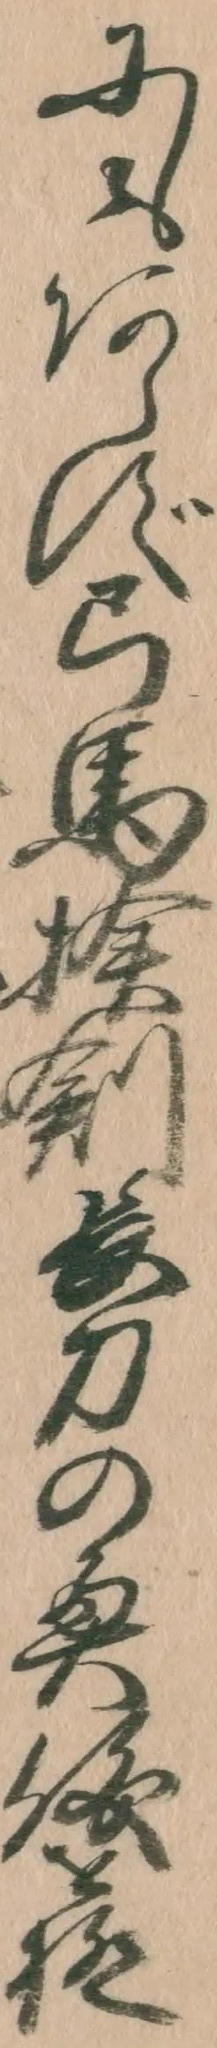にもあらず弓馬槍剣長刀の奥儀を極
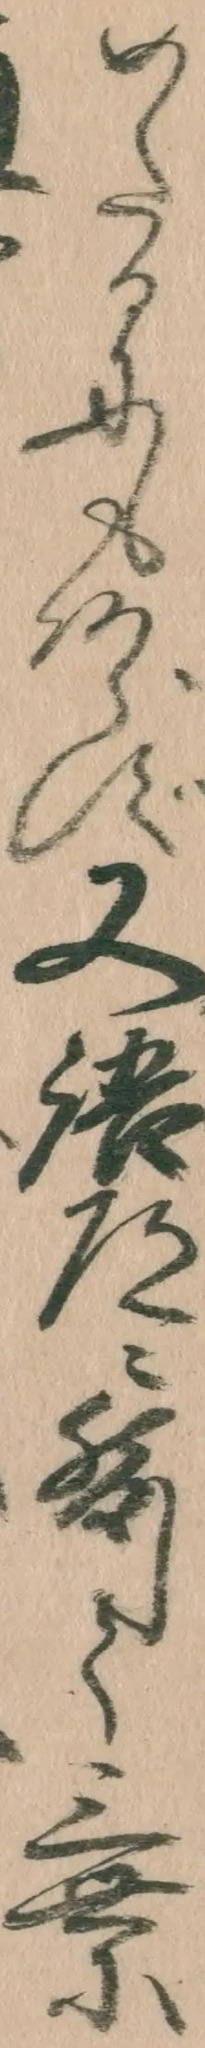めたるにもあらず又語道ニ発して三世に
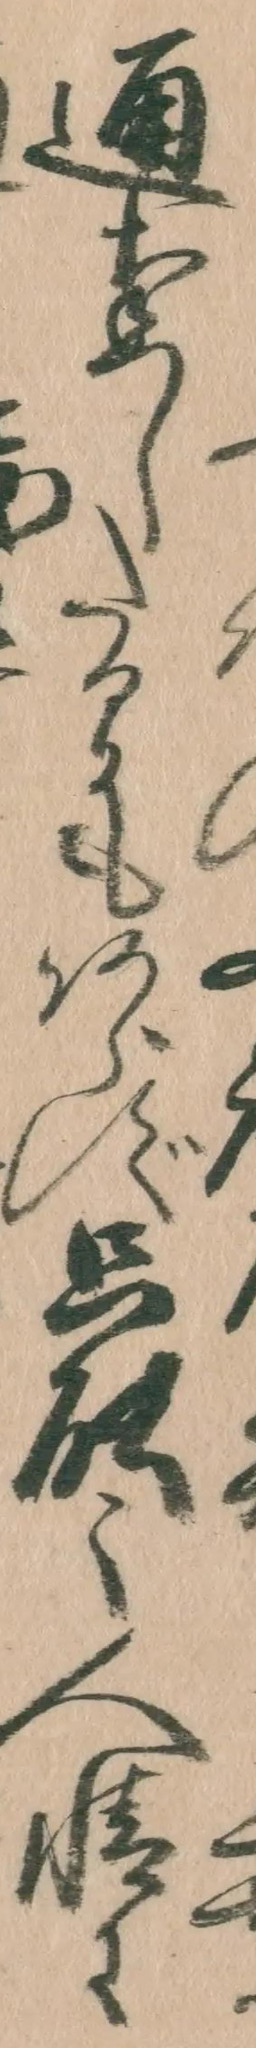通達したるにもあらず只能々人情に
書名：麗斎叢書. 20
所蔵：国立国会図書館 National Diet Library, JAPAN
